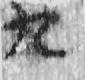九
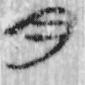月
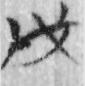戊
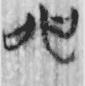申
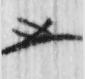之
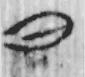日
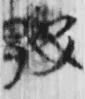○（鄢）
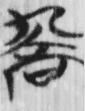喬
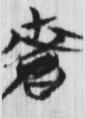差
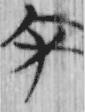宋
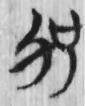加
